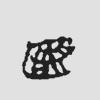匿
